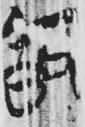○（聞）
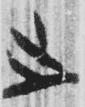之
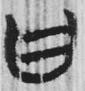曰
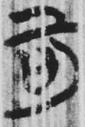可
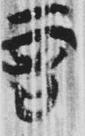言
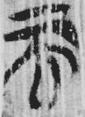而
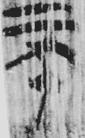不
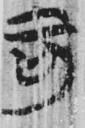可
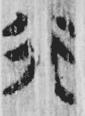行
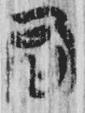君
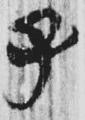子
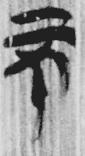不
